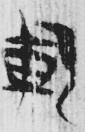○（犯）
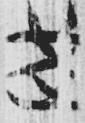武
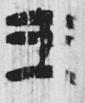王
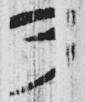乃
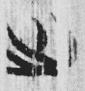出
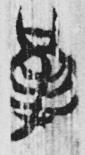革
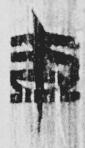車
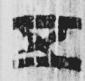五
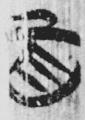百
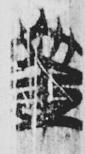𨌤
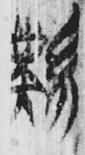○（帶）
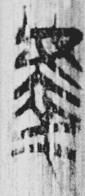○（甲）
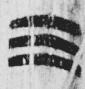三
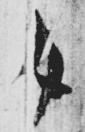千
